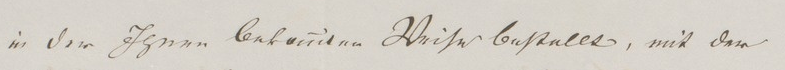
in der Ihnen bekannten Weise bestellt, mit der
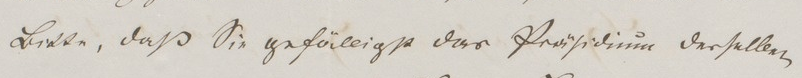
Bitte, daß Sie gefälligst das Präsidium derselben
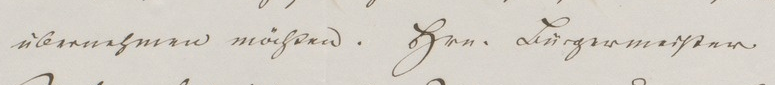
übernehmen möchten. Hrn. Bürgermeister
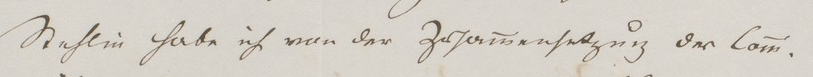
Stehlin habe ich von der Zusammensetzung der Com.
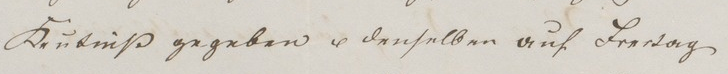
Kenntniß gegeben & denselben auf Freitag
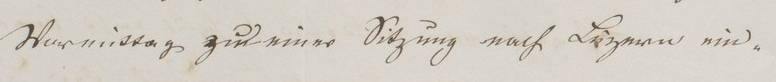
Vormittag zu einer Sitzung nach Luzern ein-
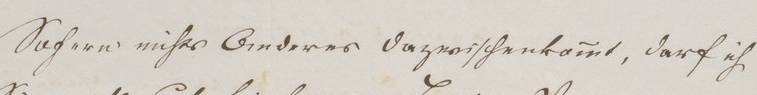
Sofern nichts Anderes dazwischenkommt, darf ich
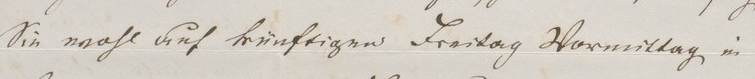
Sie wohl auf künftigen Freitag Vormittag in
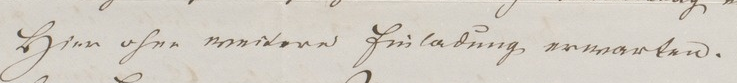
Hier ohne weitere Einladung erwarten.
